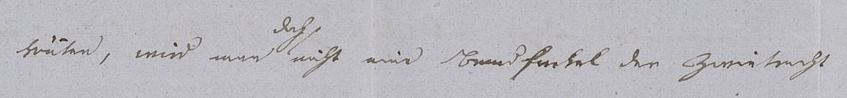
könnten, wird man doch nicht eine Brandfackel der Zwietracht
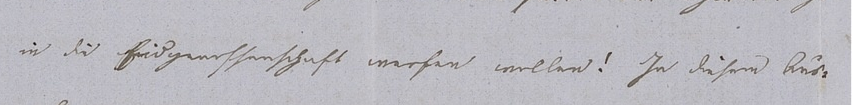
in die Eidgenossenschaft werfen wollen! In diesem Aus-
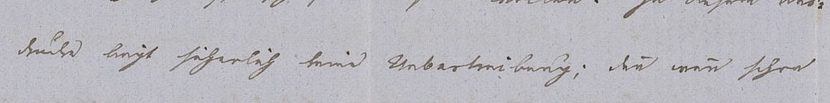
drucke liegt sicherlich keine Uebertreibung; denn wenn schon
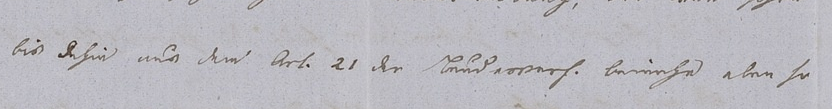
bis dahin aus dem Art. 21 der Bundesverf. beinahe eben so
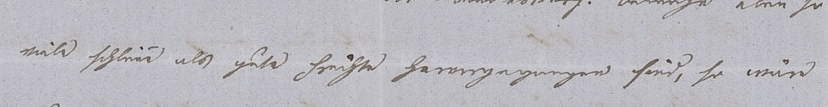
viele schlimme als gute Früchte hervorgegangen sind, so wäre
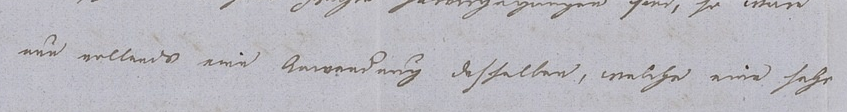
nun vollends eine Anwendung desselben, welche eine sehr
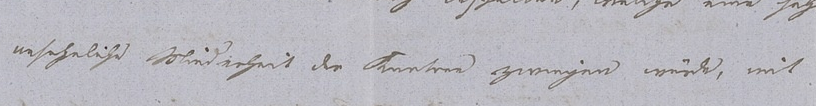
ansehnliche Minderheit der Kantone zwingen würde, mit
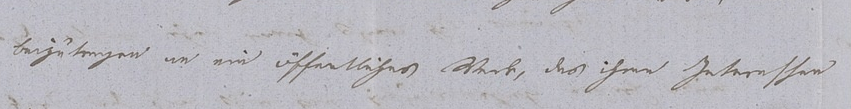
beizutragen an ein öffentliches Werk, das ihren Interessen
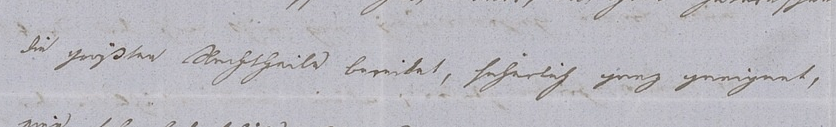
die größten Nachtheile bereitet, sicherlich ganz geeignet,
